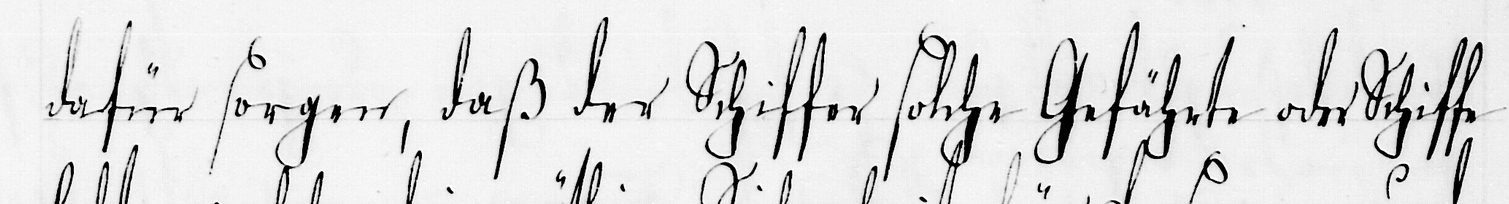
dafür sorgen, daß der Schiffer solche Gefährte
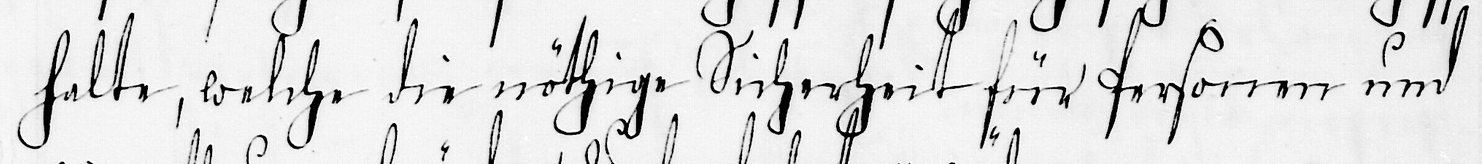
halte, welche die nöthige Sicherheit für Personen und
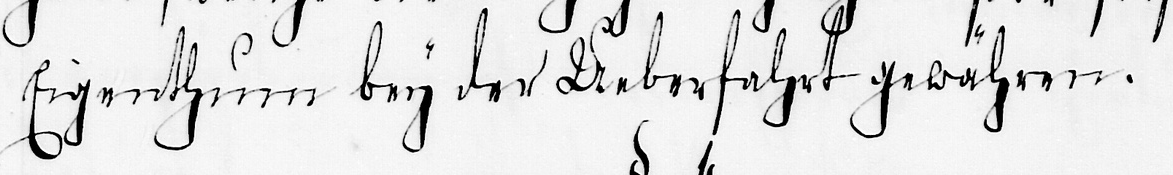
Eigenthum bey der Ueberfahrt gewähren.
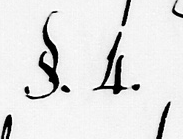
§. 4.
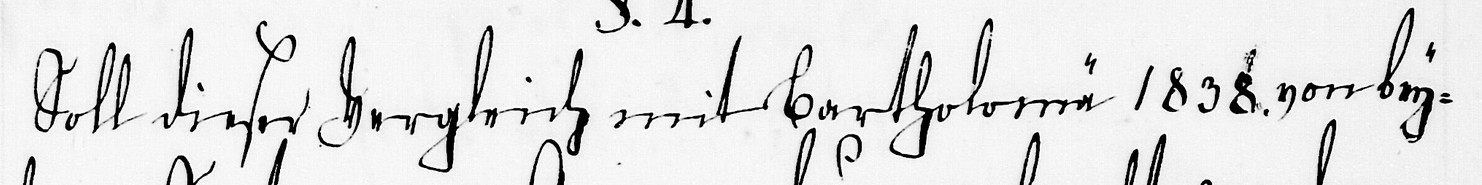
Soll dieser Vergleich mit Bartholomä 1838. von bey¬
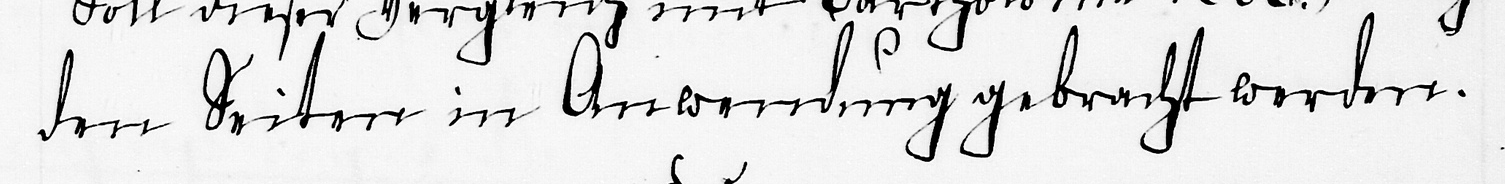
den Seiten in Anwendung gebracht werden.
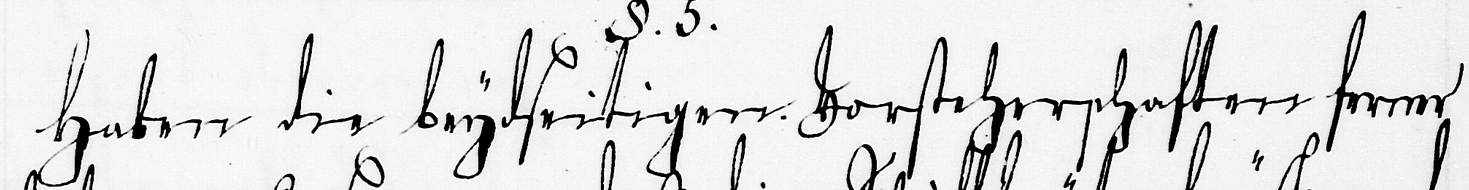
Haben die beydseitigen Vorsteherschaften ferner
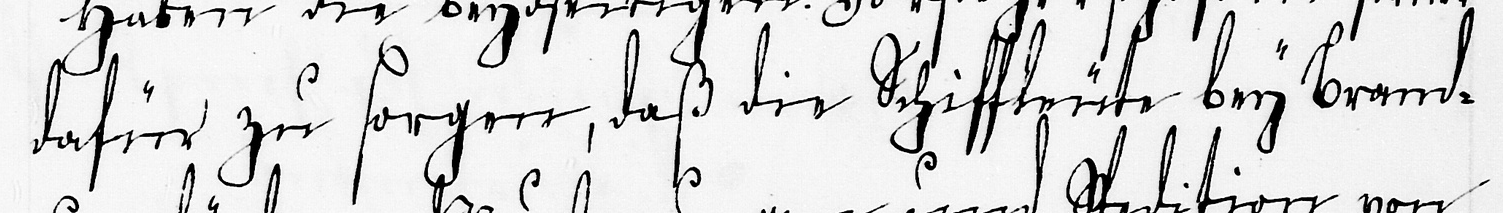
dafür zu sorgen, daß die Schiffleute bey Brand¬
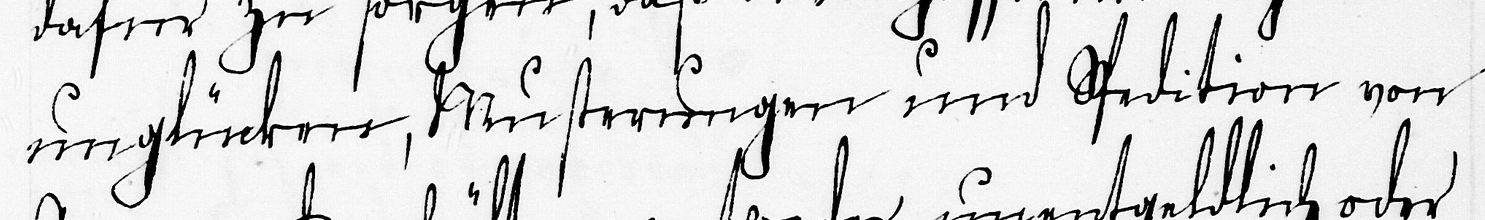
unglücken, Musterungen und Spedition von
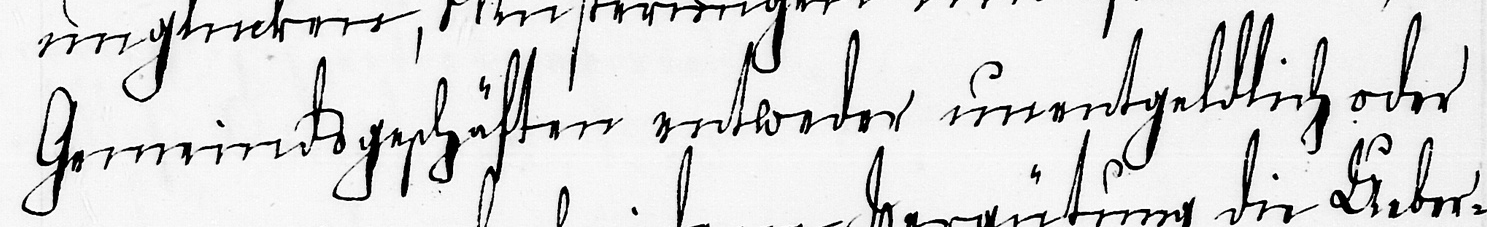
Gemeindsgeschäften entweder unentgeldlich oder
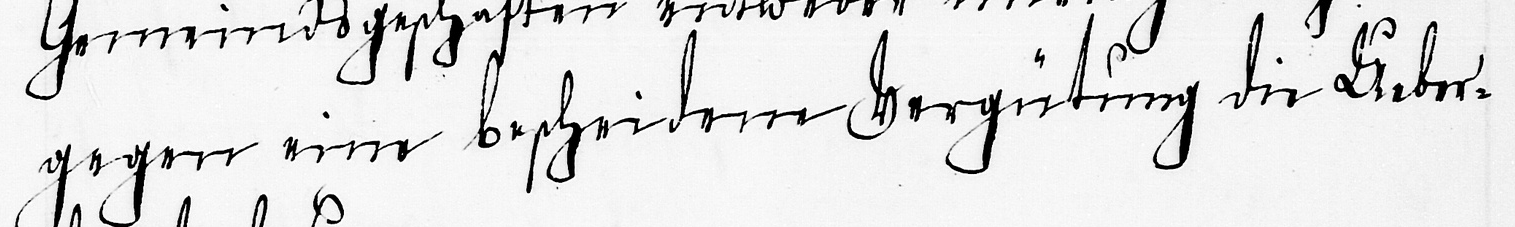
gegen eine bescheidene Vergütung die Ueber¬
